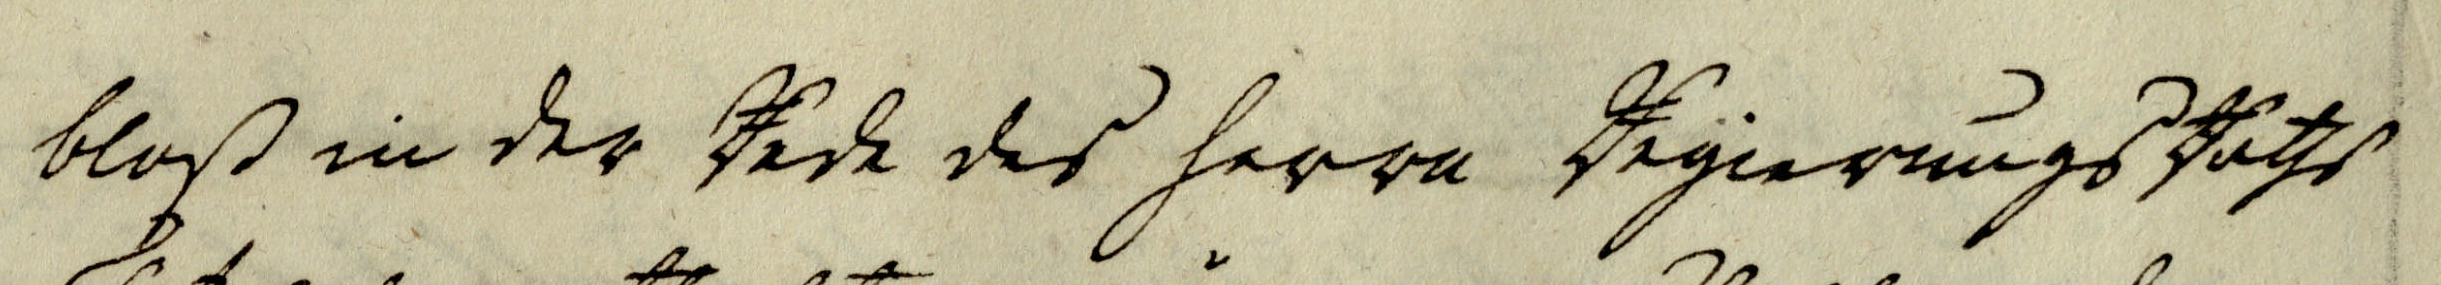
bloß in der Rede des Herrn Regierungs Raths
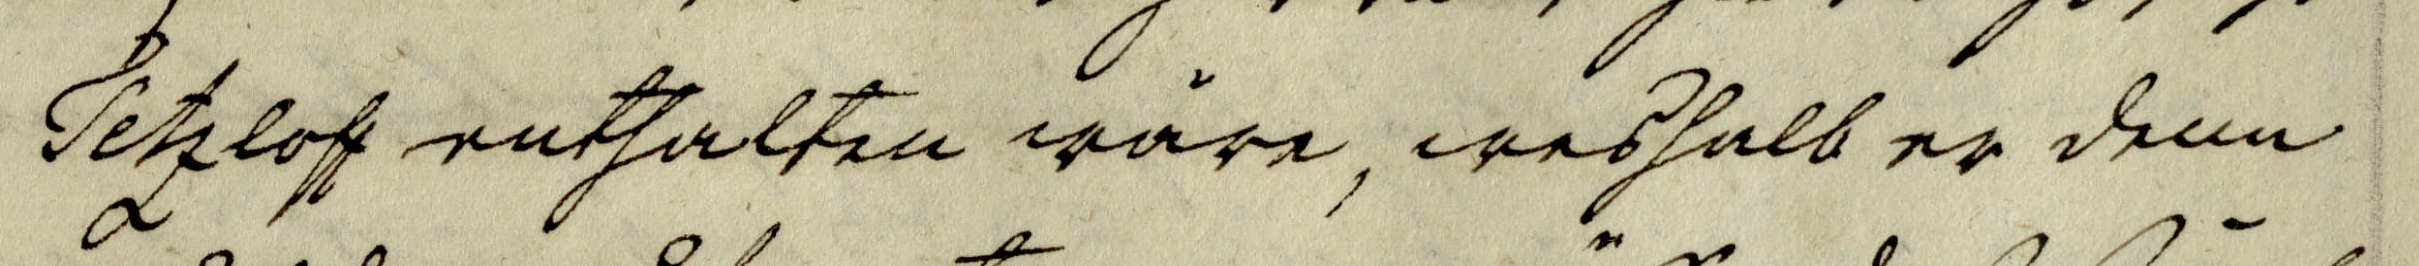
Tetzloff enthalten wäre, weshalb er denn
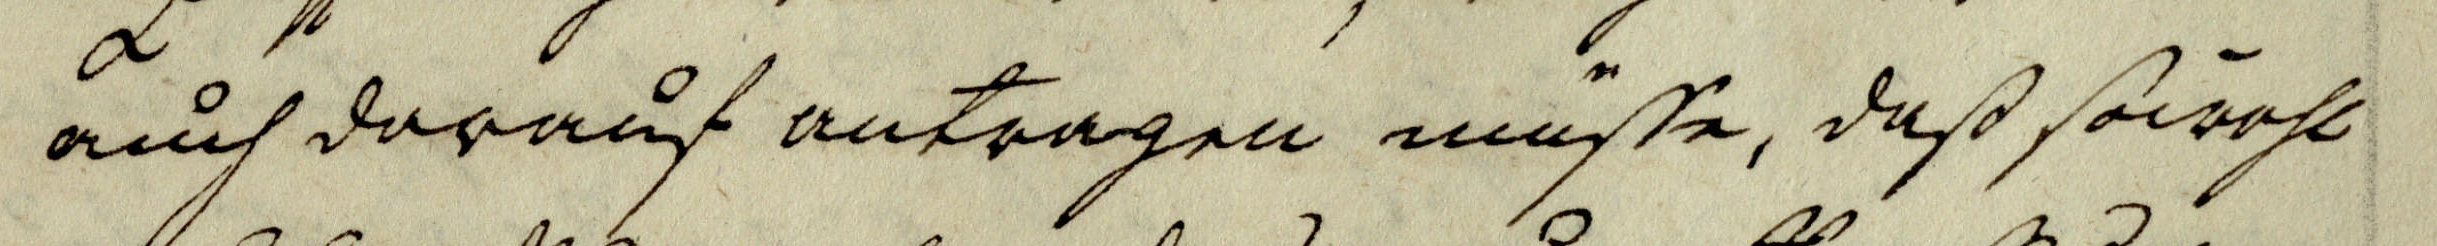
auch darauf antragen müsse, daß sowohl
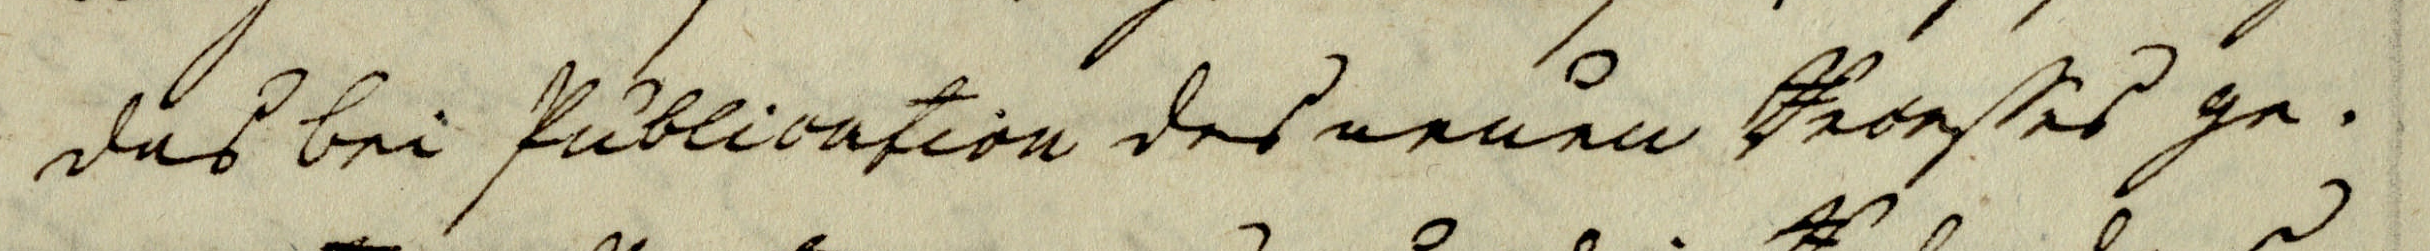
das bei Publication des neuen Recesses ge¬
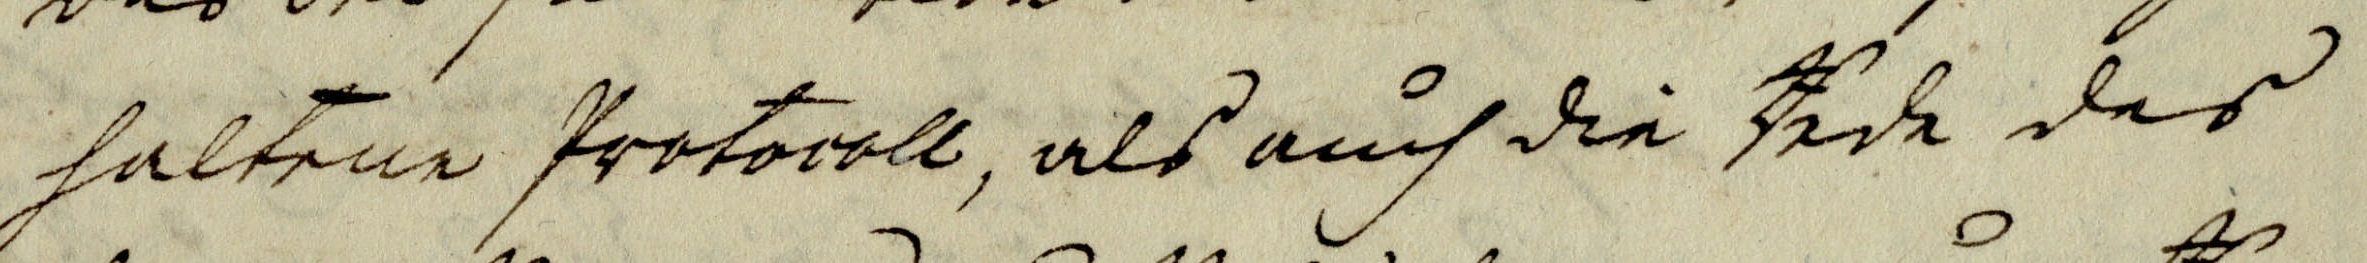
haltene Protocoll, als auch die Rede des
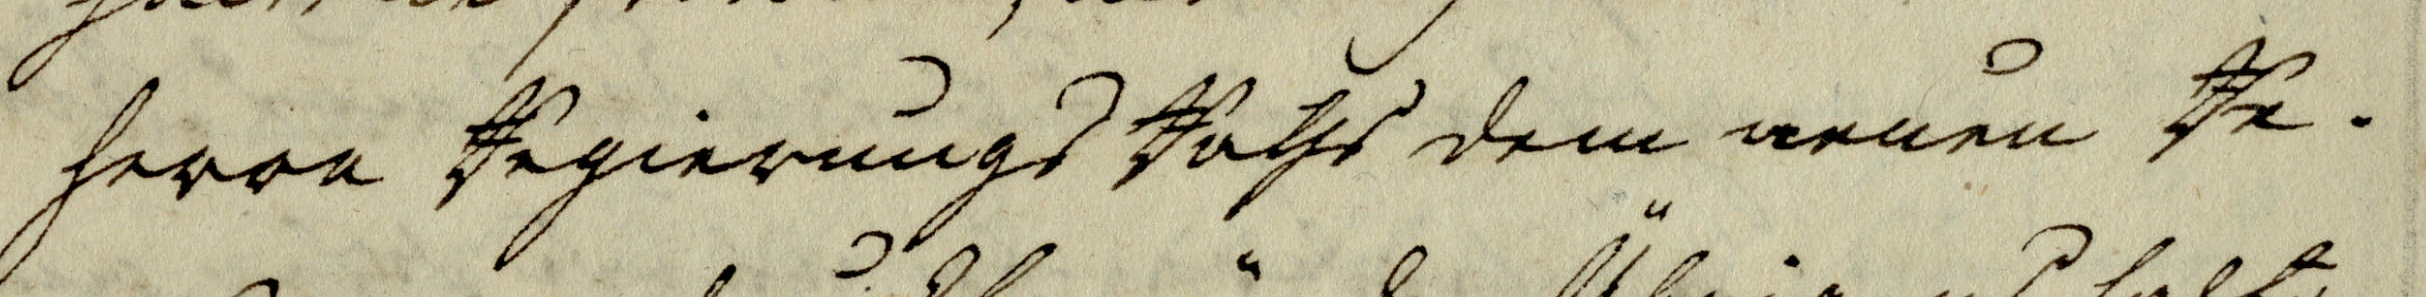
Herrn Regierungs Raths dem neuen Re¬
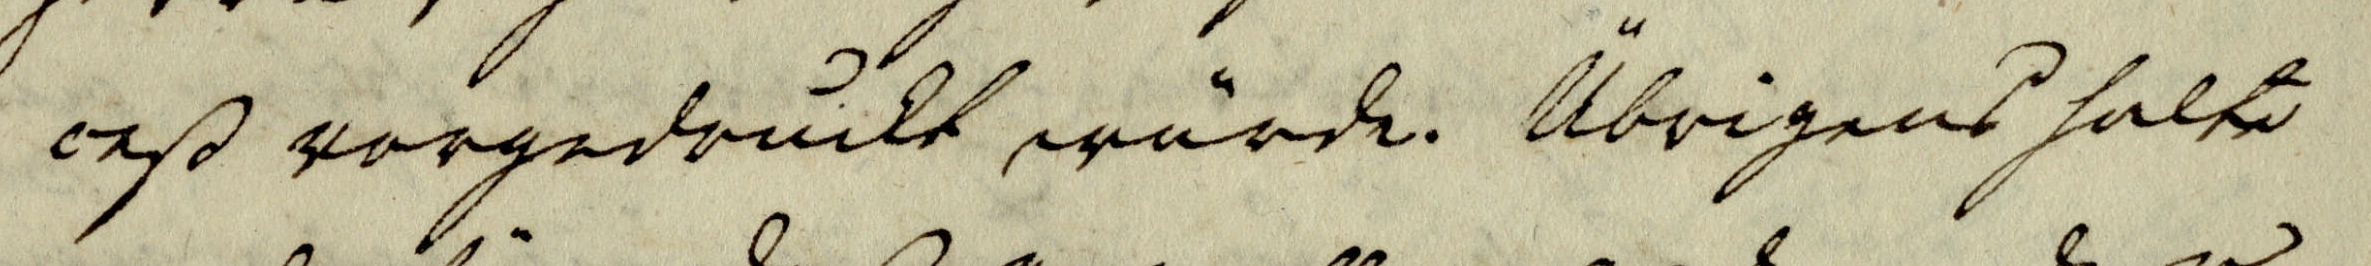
ceß vorgedruckt würde. Übrigens halte
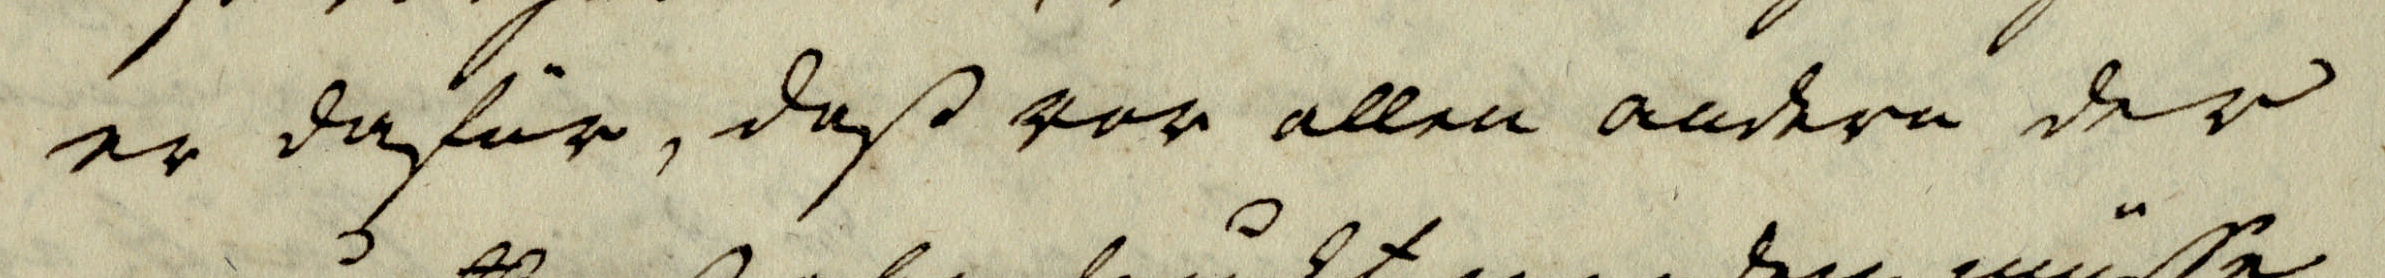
er dafür, daß vor allen andern der
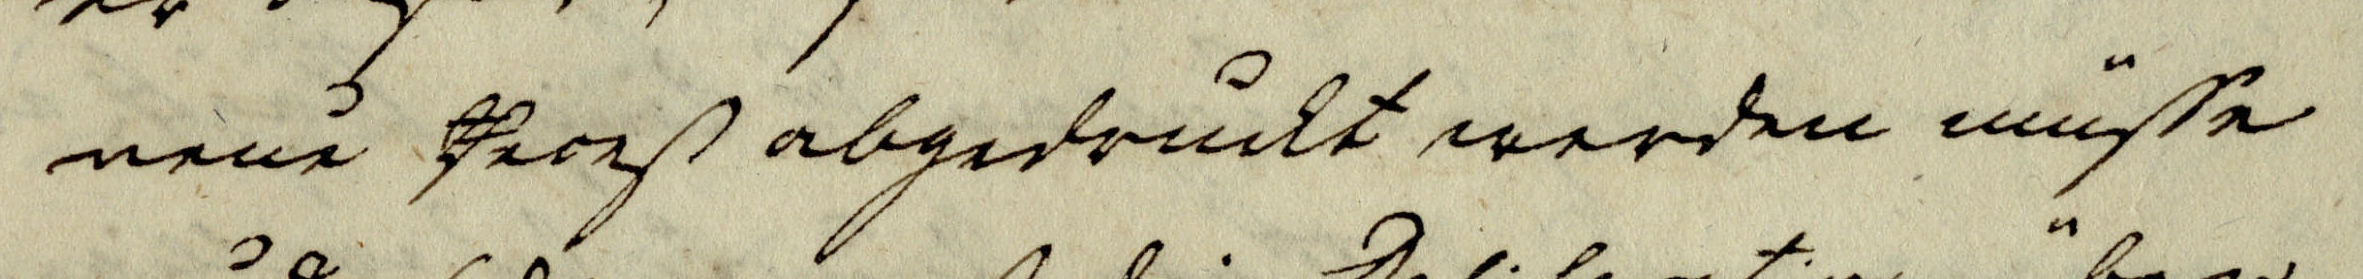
neue Receß abgedruckt werden müsse
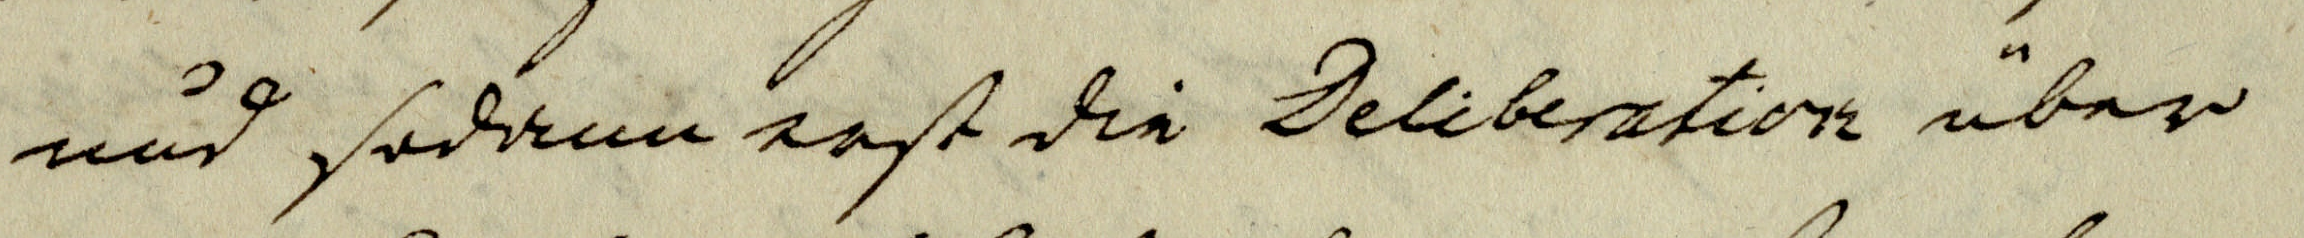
und sodann erst die Deliberation über
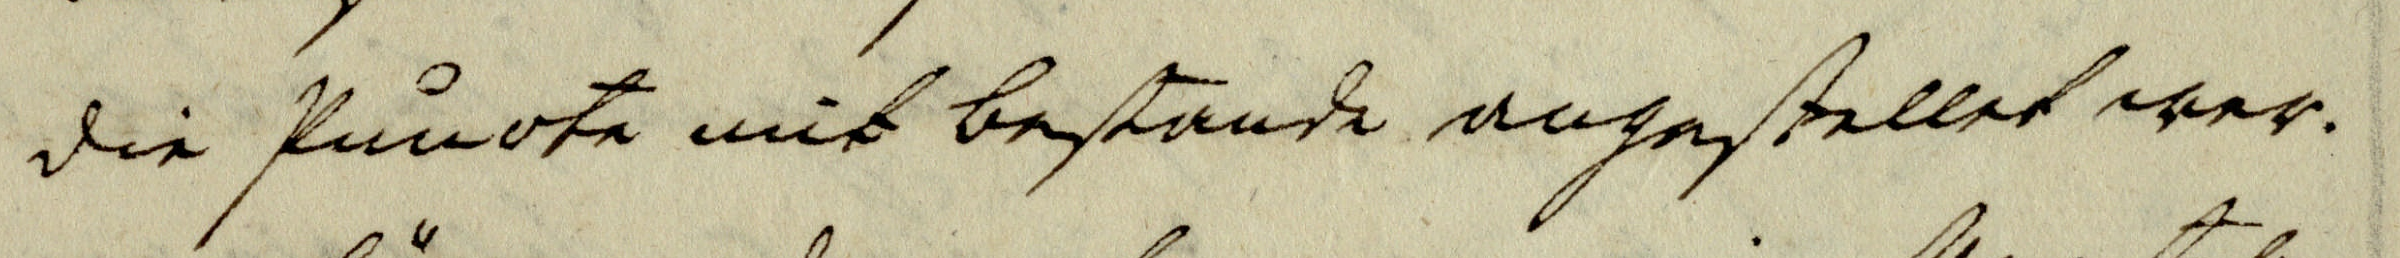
die Puncte mit Bestande angestellet wer¬
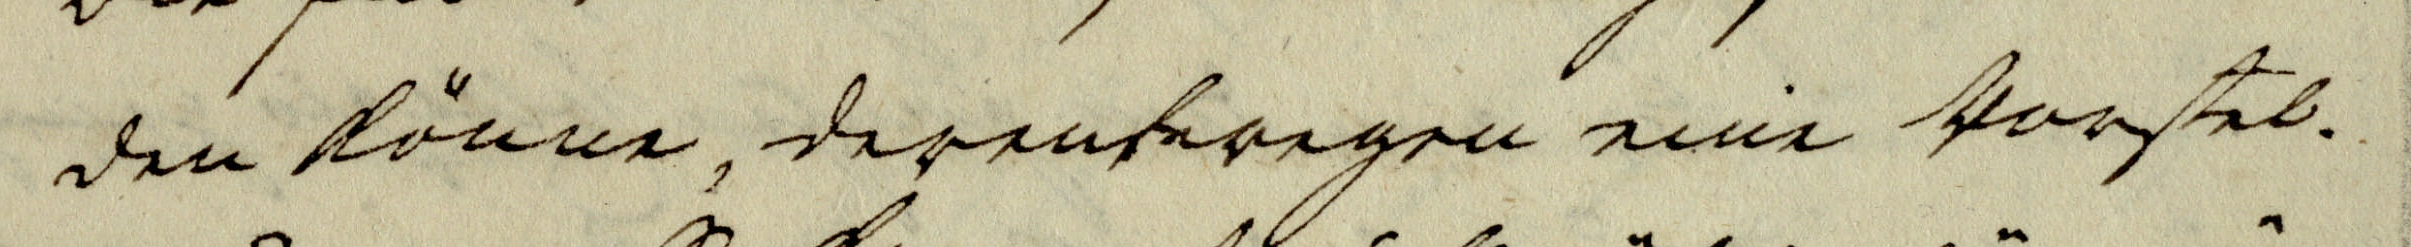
den könne, derentwegen eine Vorstel¬
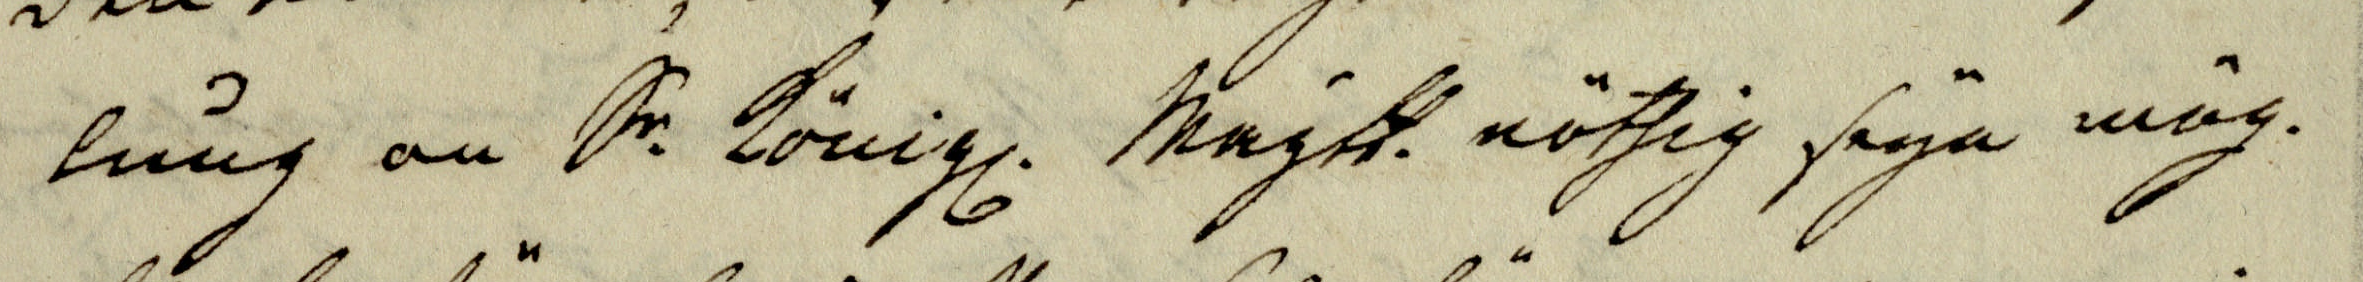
lung an Sr Königl. Maÿtt. nöthig seÿn mög¬
